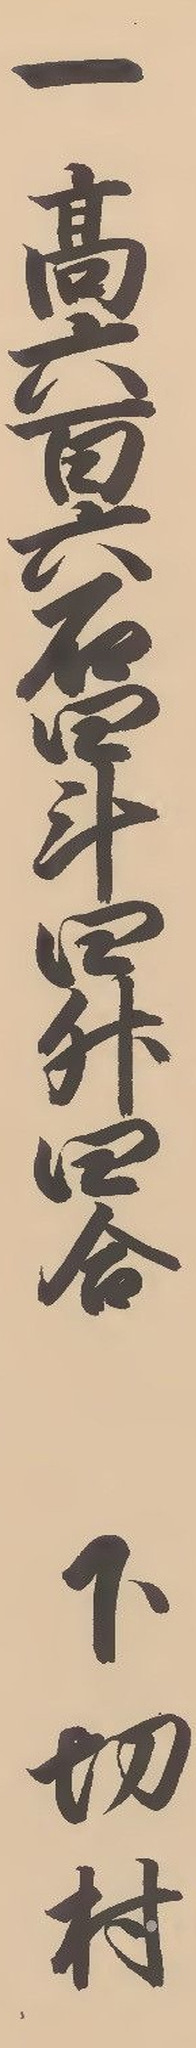一高六百六石四斗四升四合下切村
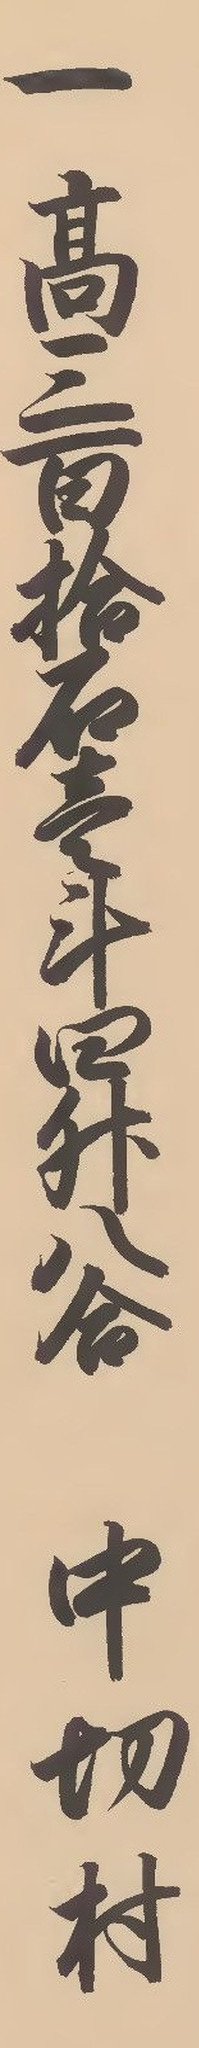一高三百拾石壱斗四升八合中切村

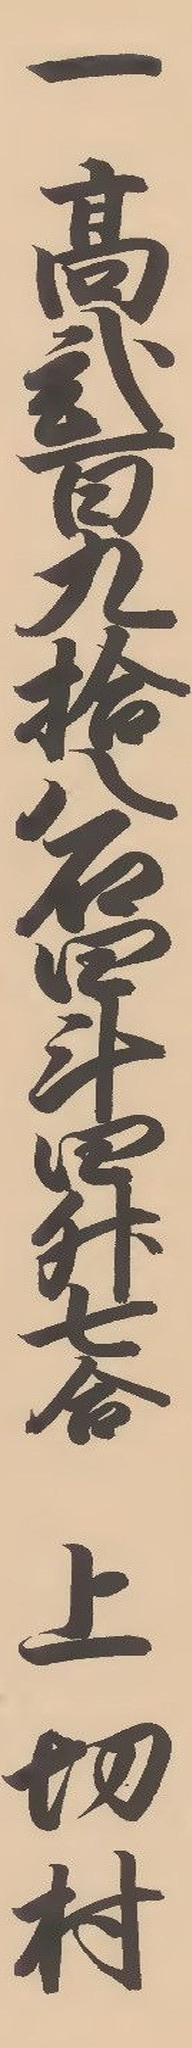一高弐百九拾八石四斗四升七合上切村
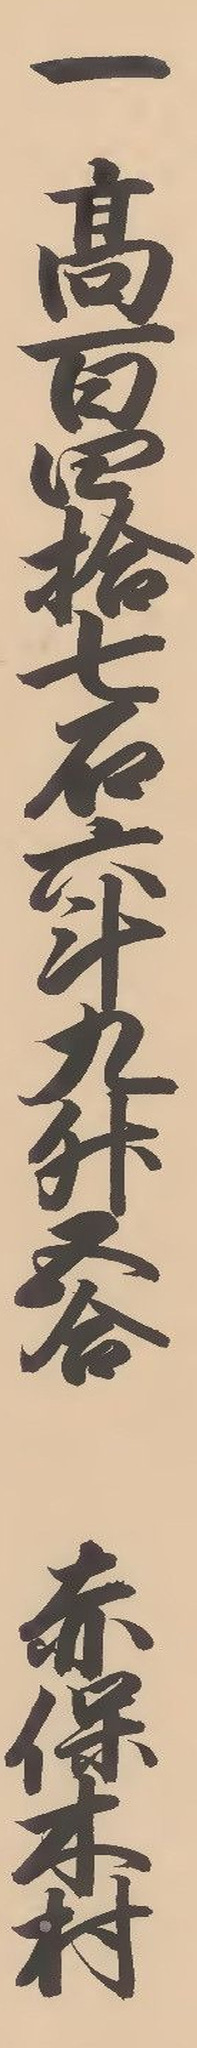一高百四拾七石六斗九升五合赤保木村
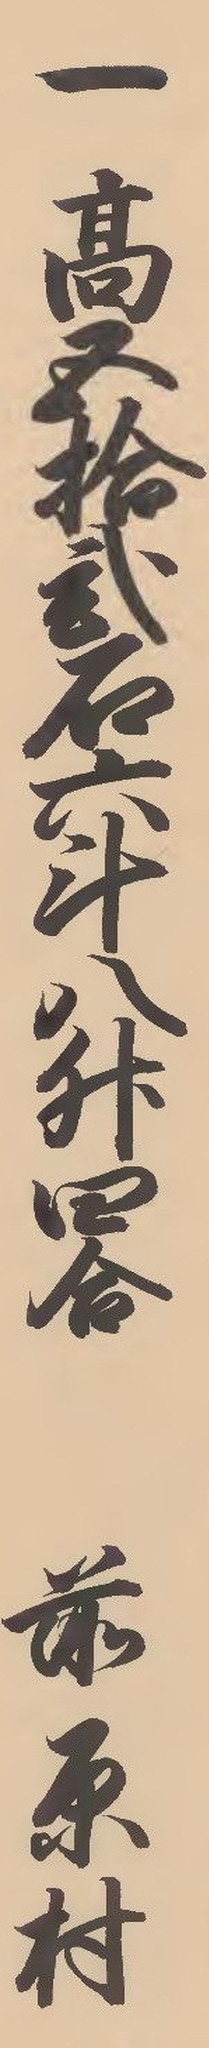一高五拾弐石六斗八升四合前原村
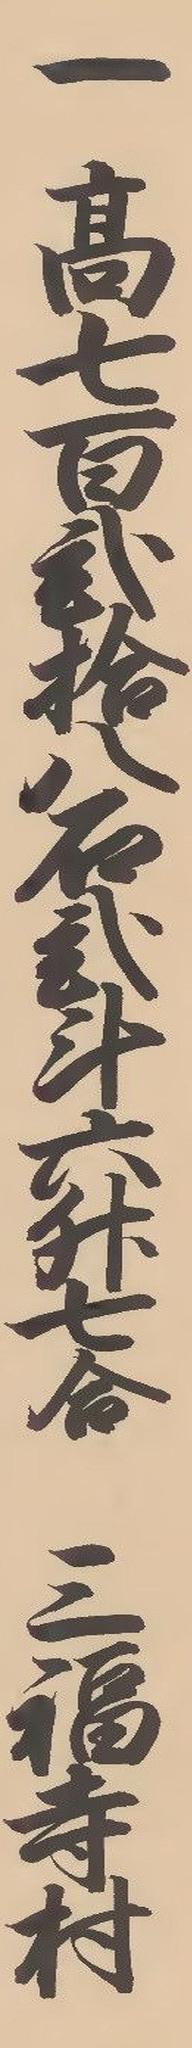一高七百弐拾八石弐斗六升七合三福寺村
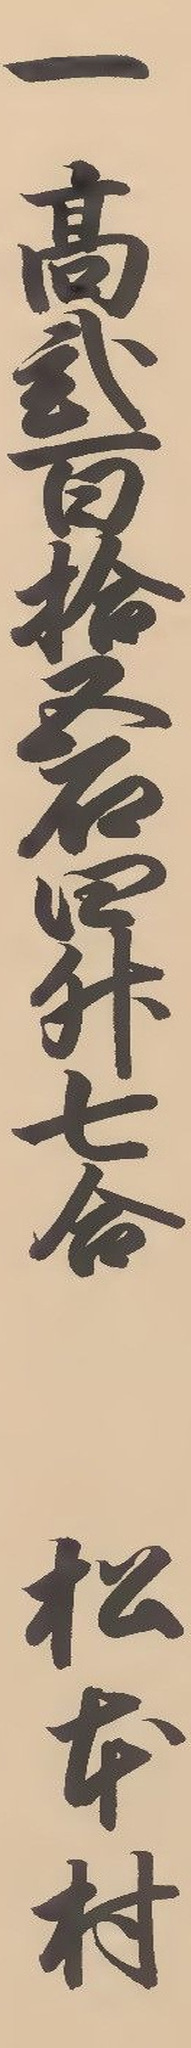一高弐百拾五石四升七合松本村
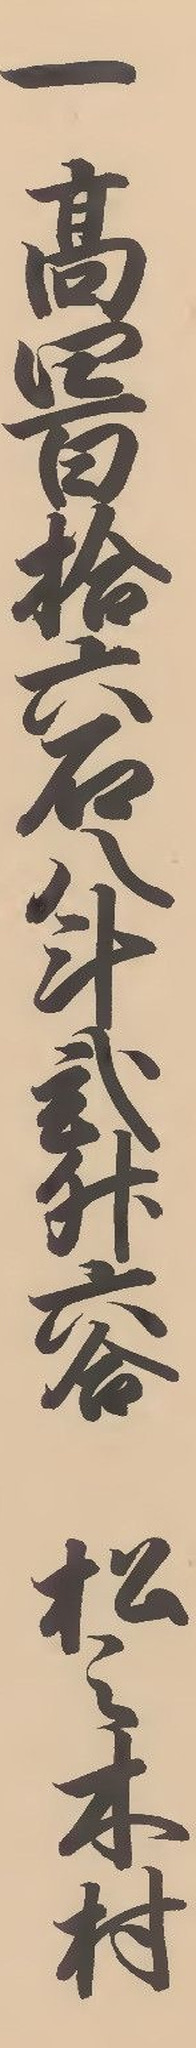一高四百拾六石八斗弐升六合松之木村
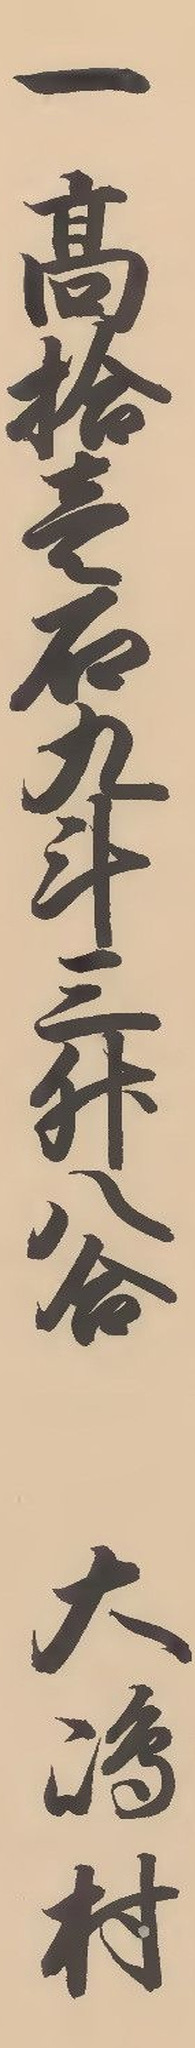一高拾壱石九斗三升八合大島村
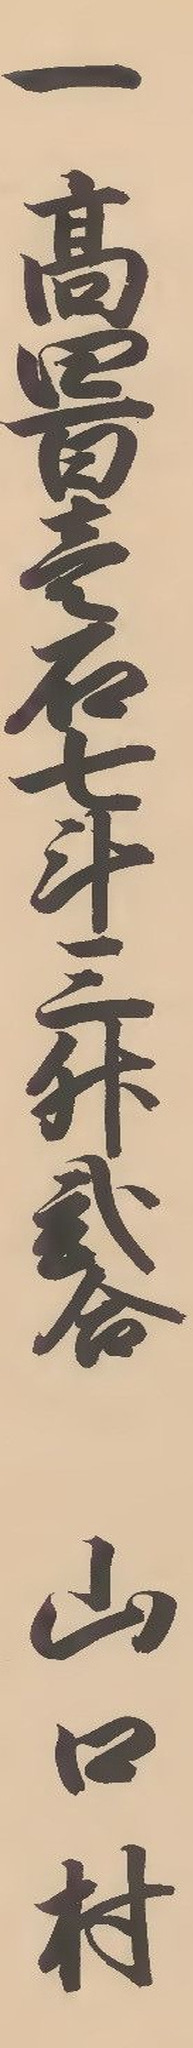一高四百壱石七斗三升弐合山口村

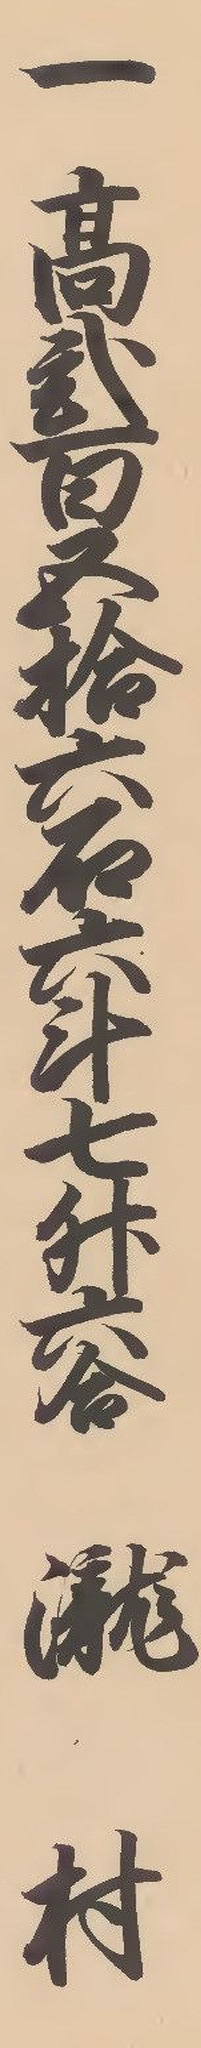一高弐百五拾六石六斗七升六合滝村
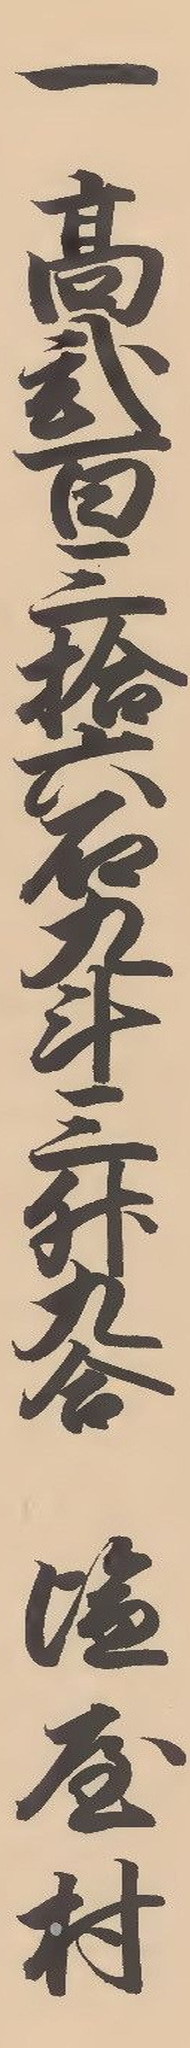一高弐百三拾六石九斗三升九合塩屋村
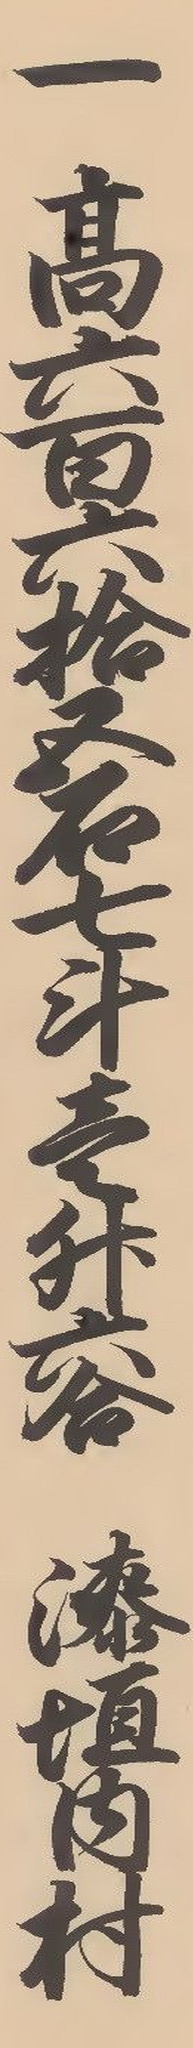一高六百六拾五石七斗壱升六合漆垣内村
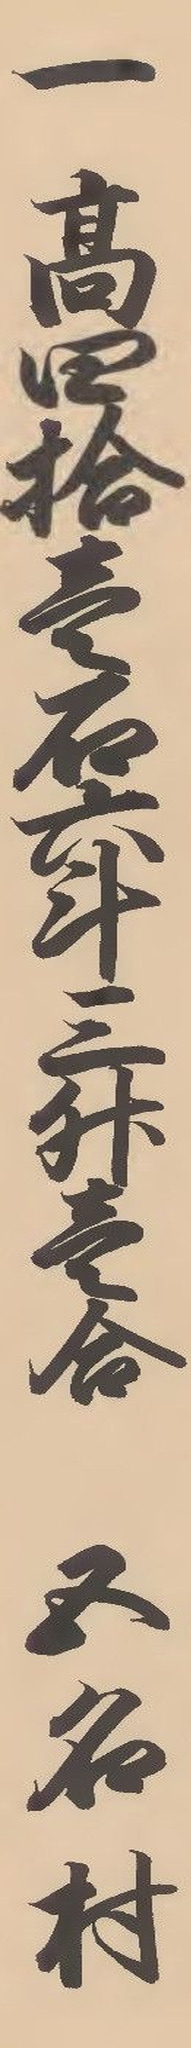一高四拾壱石六斗三升壱合五名村
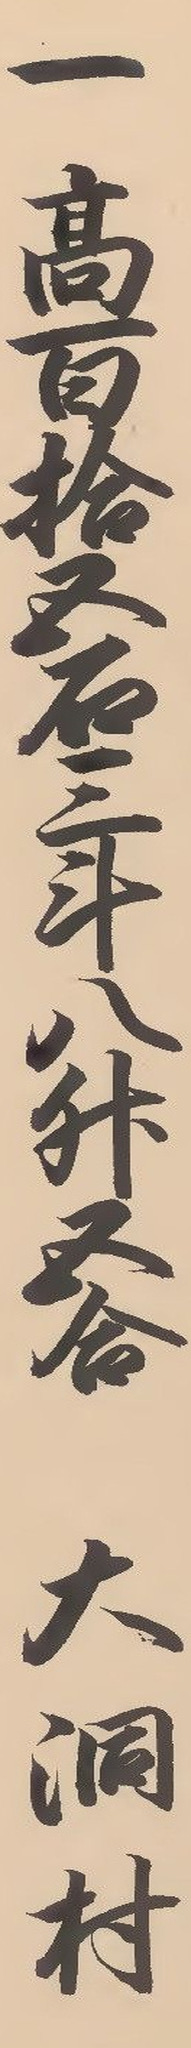一高百拾五石三斗八升五合大洞村
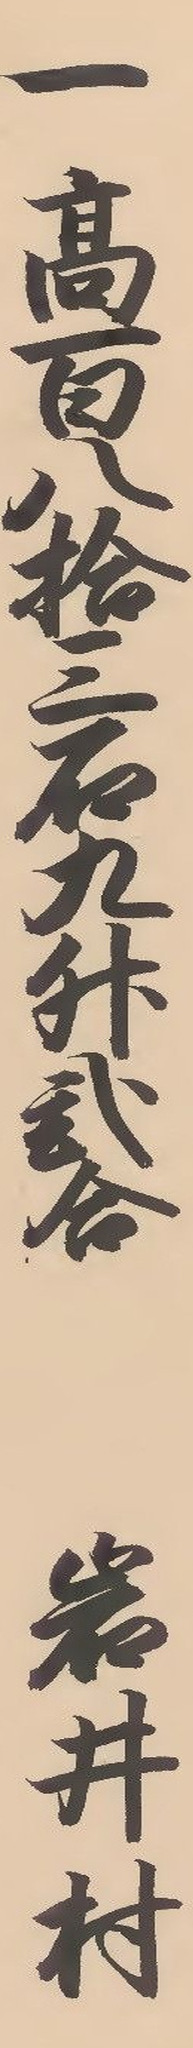一高百八拾三石九升弐合岩井村
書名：飛騨国郷帳
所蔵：国立公文書館 National Archives of Japan
